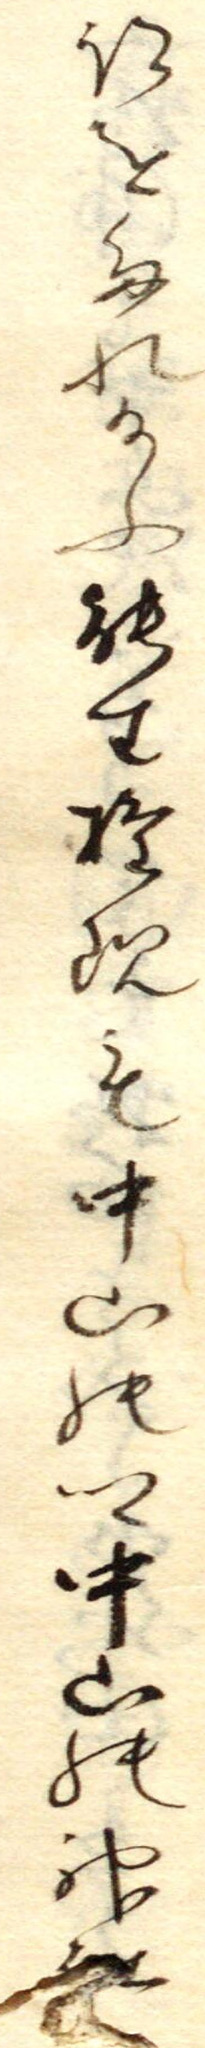跡をたれ給ふ能生権現も中山の郷な中山の神社

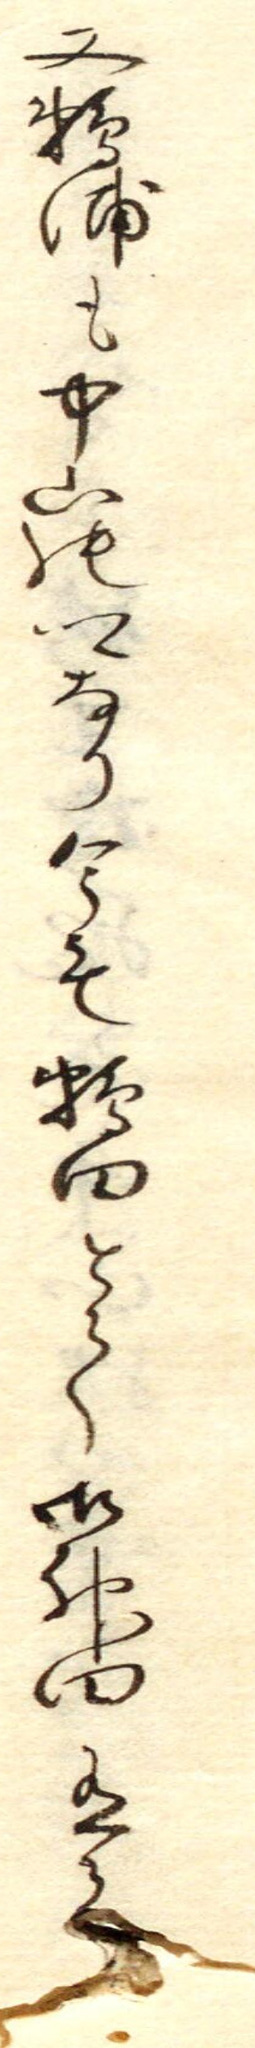又鵜浦も中山の郷なり今も鵜田とて御神田有之
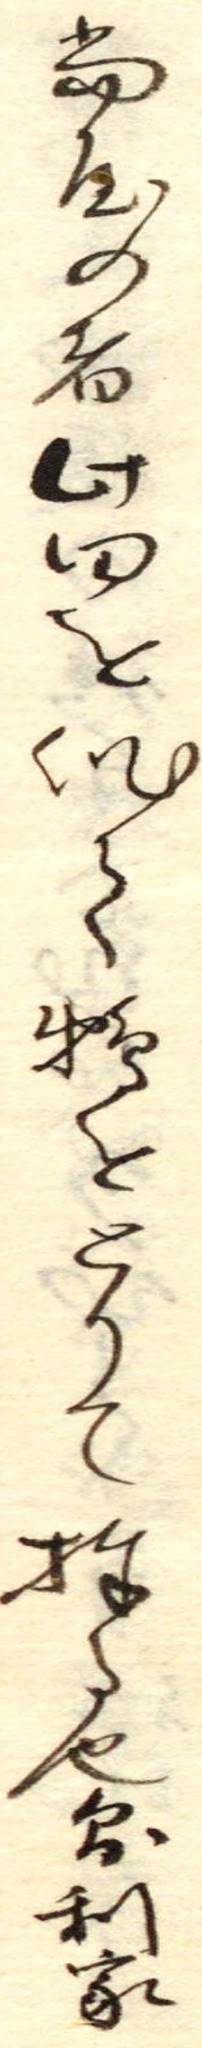当屋の者此田を作て鵜をとりて捧る也則利家
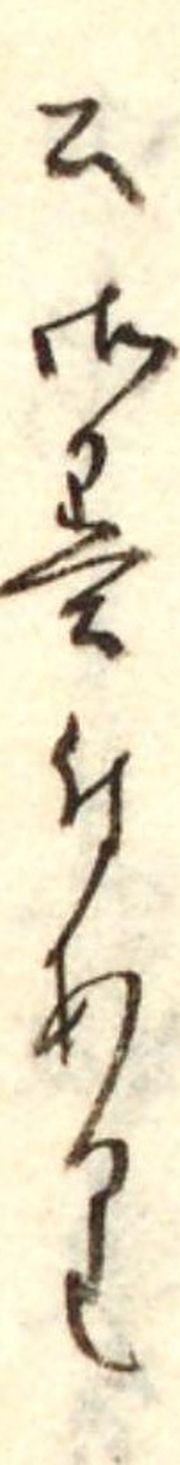公御墨付あり
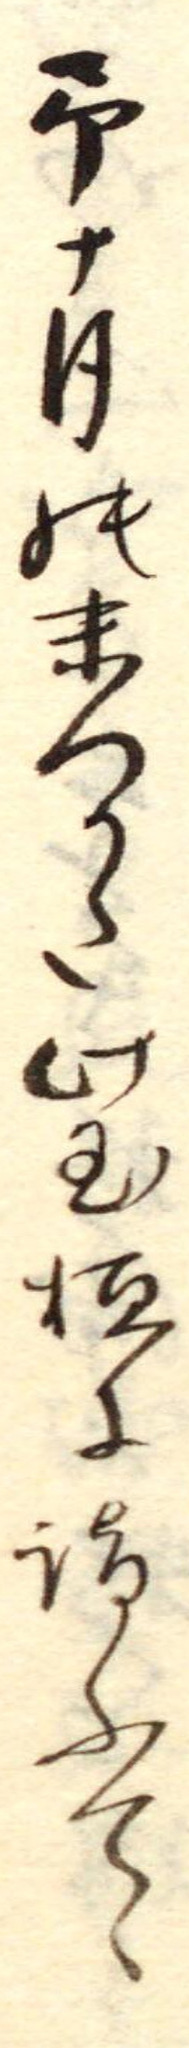即十月の末つかた此玉垣に詣ふてゝ
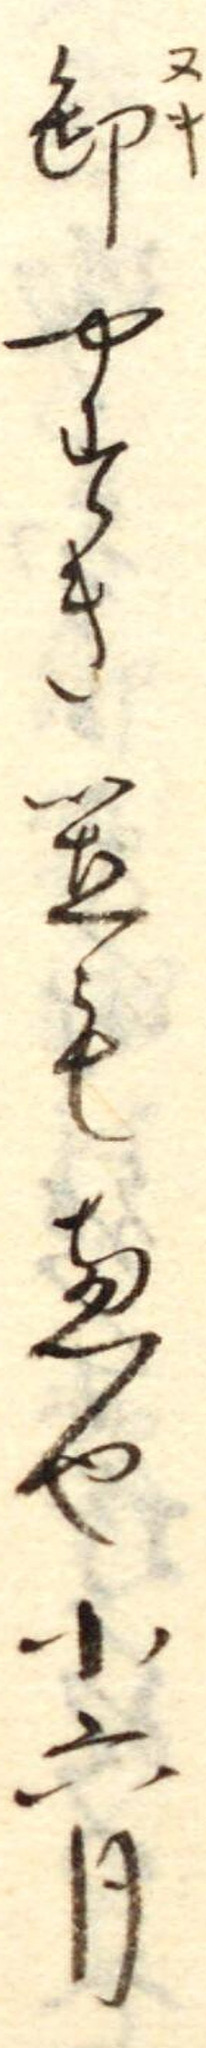卸やすき笠も恵や小六月
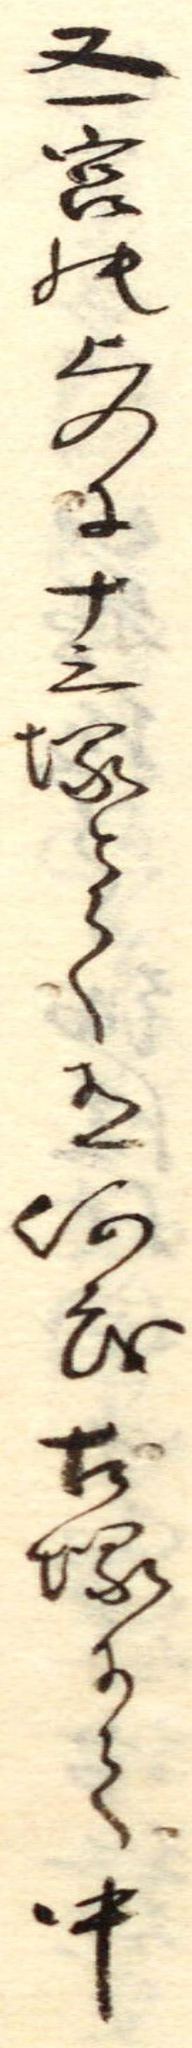又一宮の上のに十三塚とて有何も子古塚中
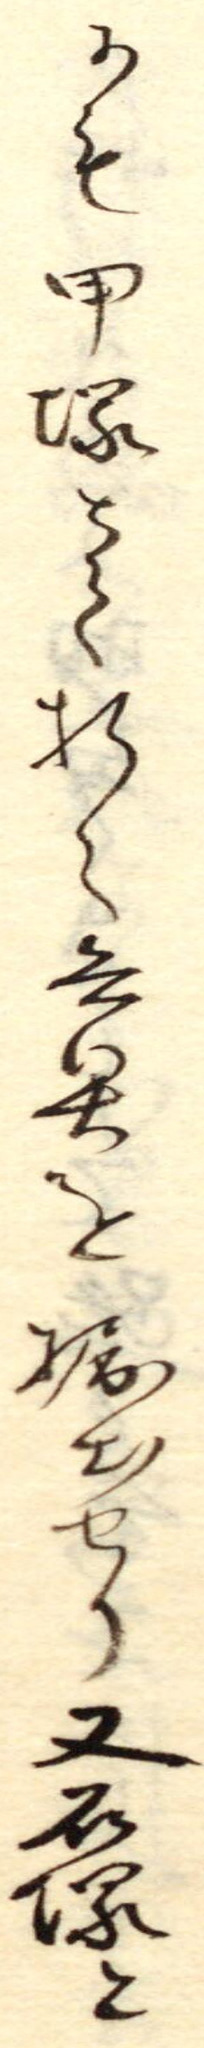にも甲塚とて折々兵具を掘出せり又石塚と
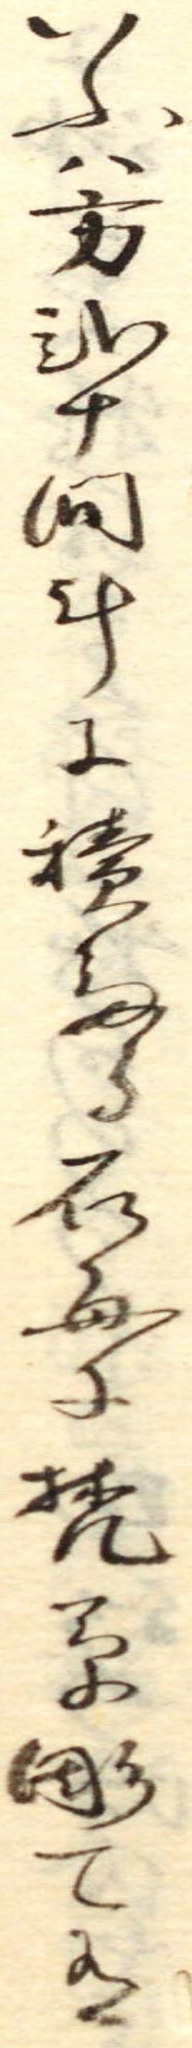いふは方弐十間計に積たる石毎に梵草彫て有
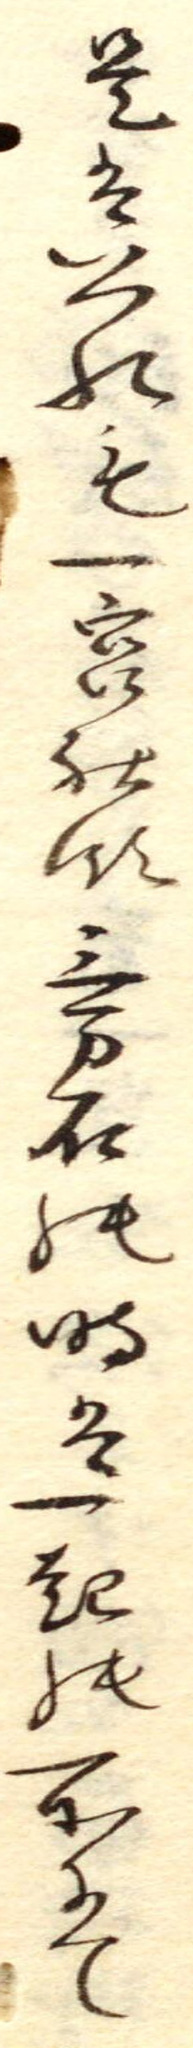是はいつれも一宮社領三万石の時は一起の所にて
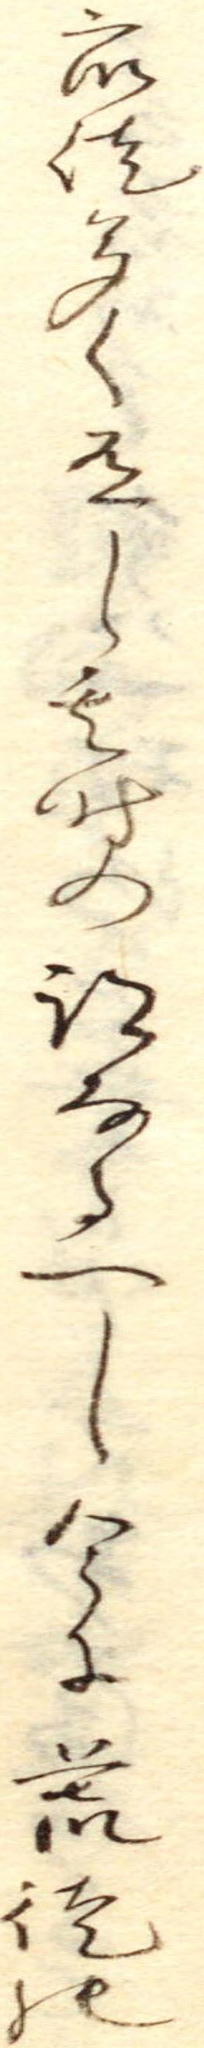衆徒多く有し其時の跡なるへし今に荒徒の
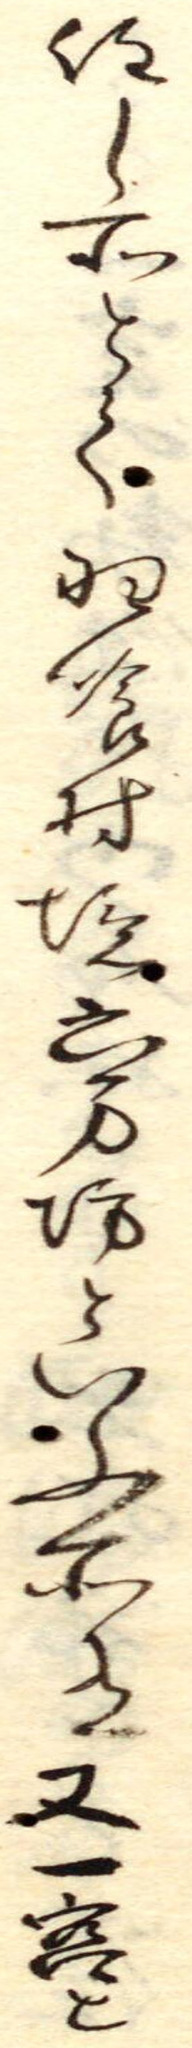住し所とて羽喰村境六万坊といふ所有又一宮と
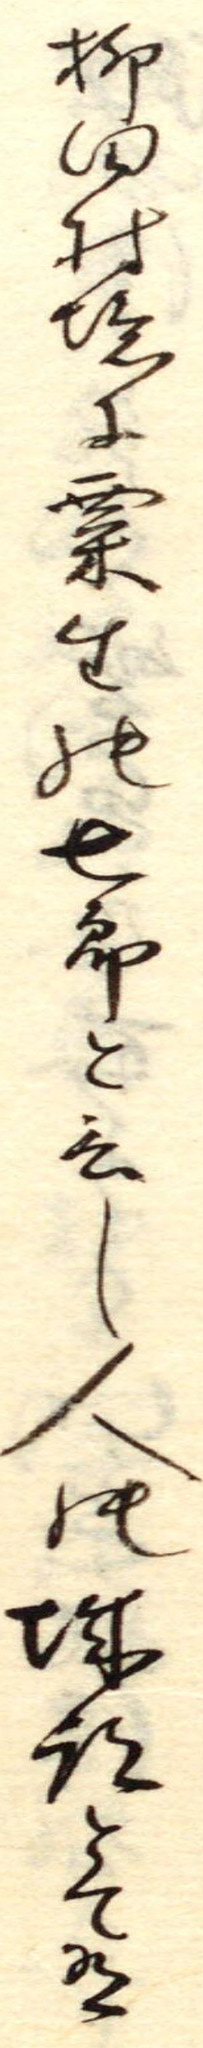柳田村境に粟生の七郎と云し人の城跡とて有
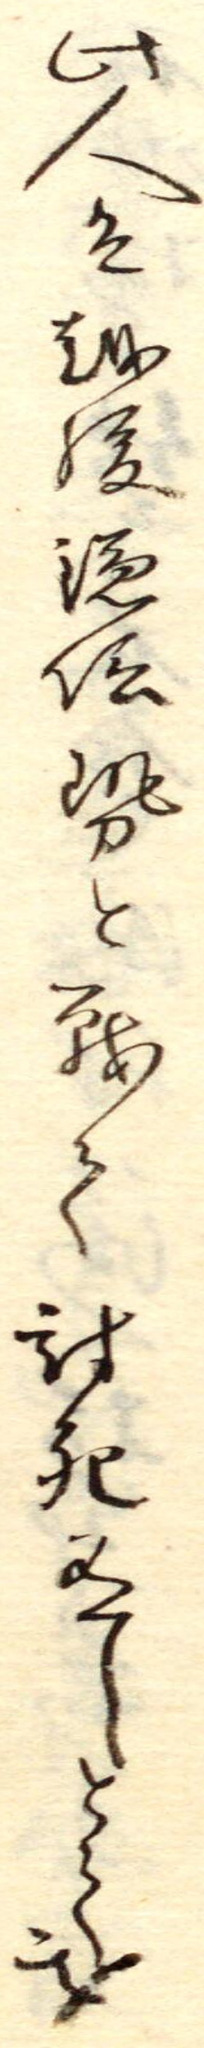此人は越後謙信勢と戦て討死有しとて
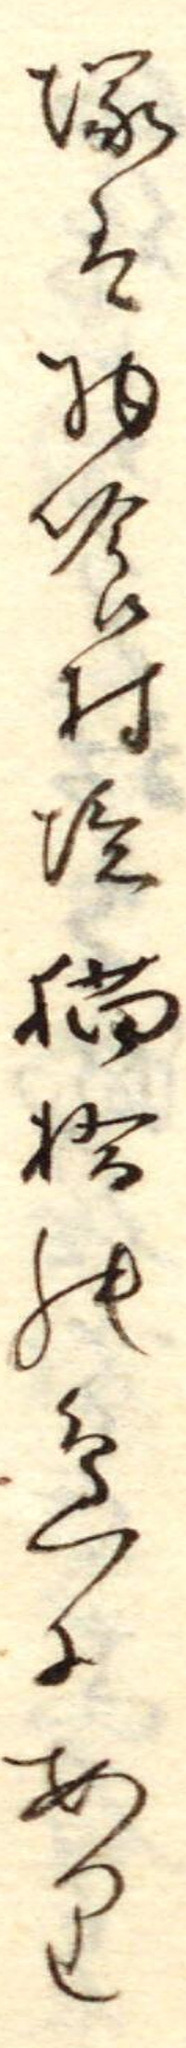塚は羽喰村境猫橋の辺にあり
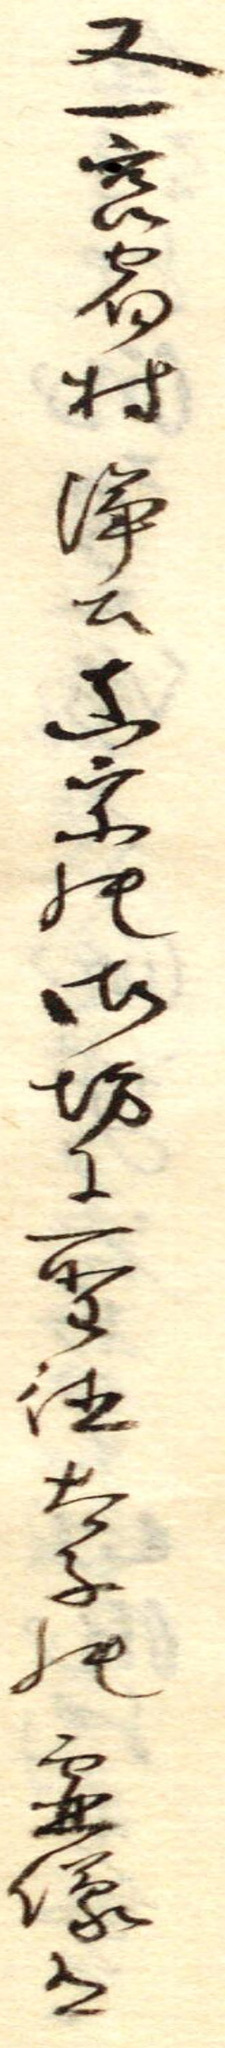又一宮宿村浄土真宗の御坊に聖徳太子の霊像有
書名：能登名跡誌
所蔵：Ishikawa Prefectural Library
